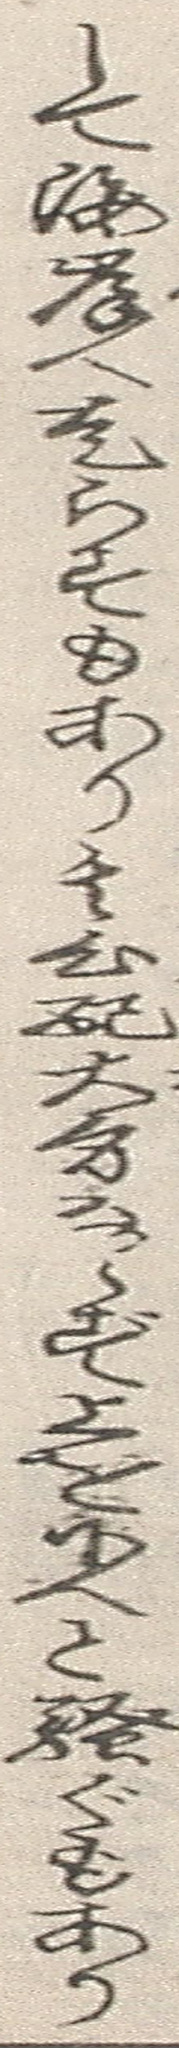して海岸へ走らすもあり其心配大方ならず上を下へと騒ぐもあり
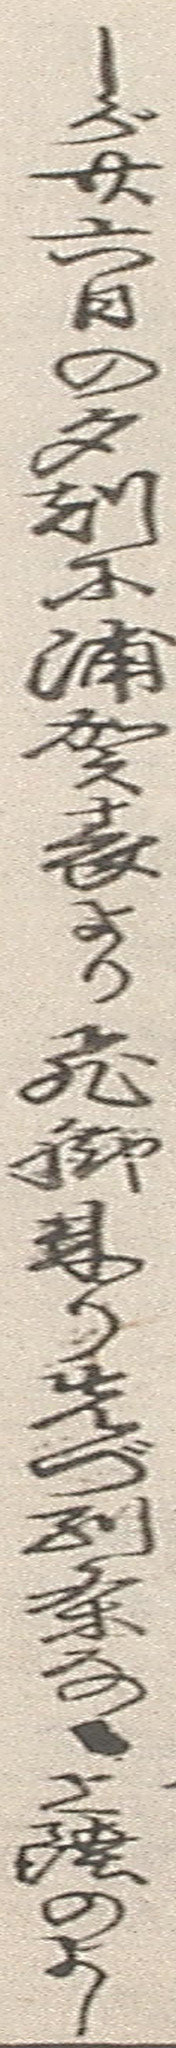しが廿六日の夕刻に浦賀表より飛脚来り先ず別条なく上陸のよし
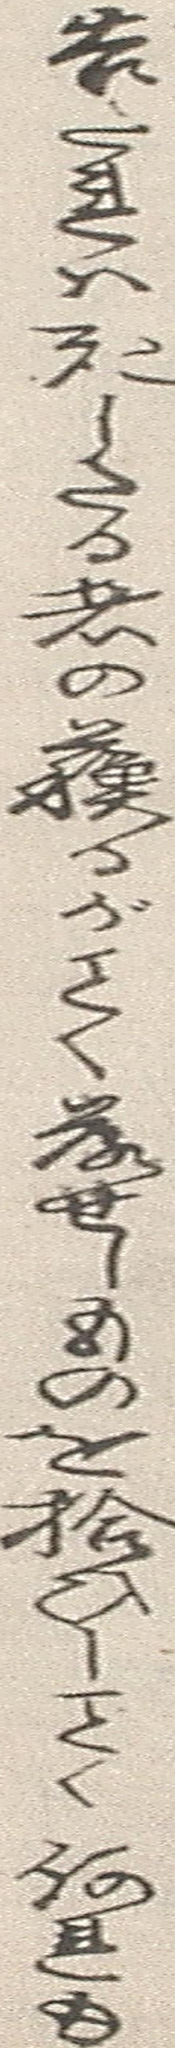告たれハ死したる者の蘓るがことく落せしものを拾ひしことく何れも
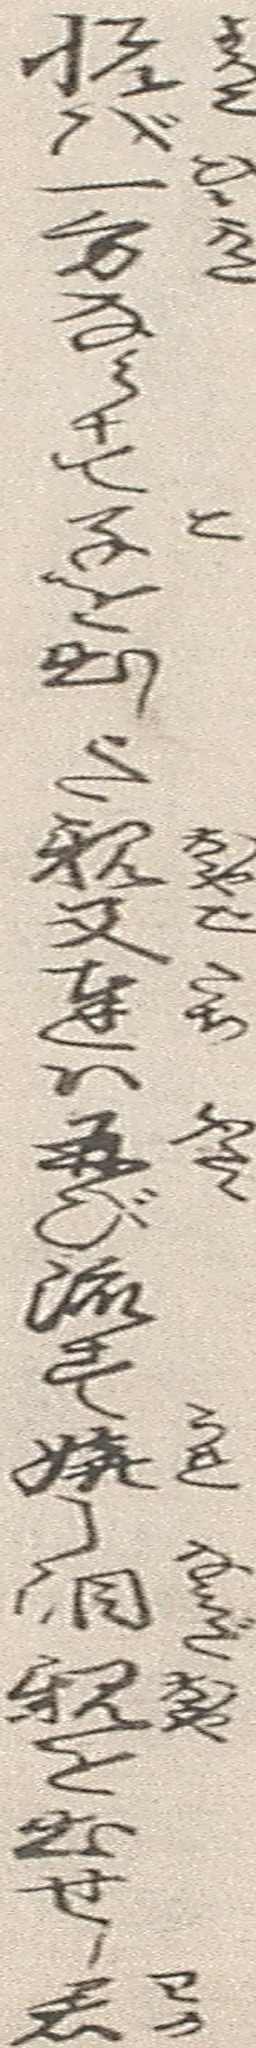悦び一方ならす子を出した親父達ハ再び流す嬉し泪親を出せし若
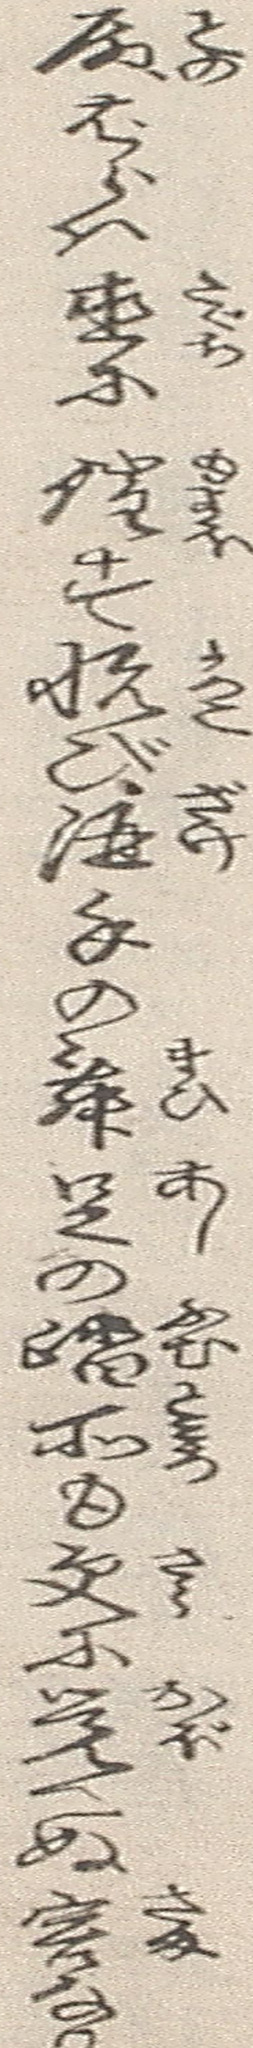殿はらハ直に催す悦び酒手の舞足の踏所も更に覚へぬ容なり
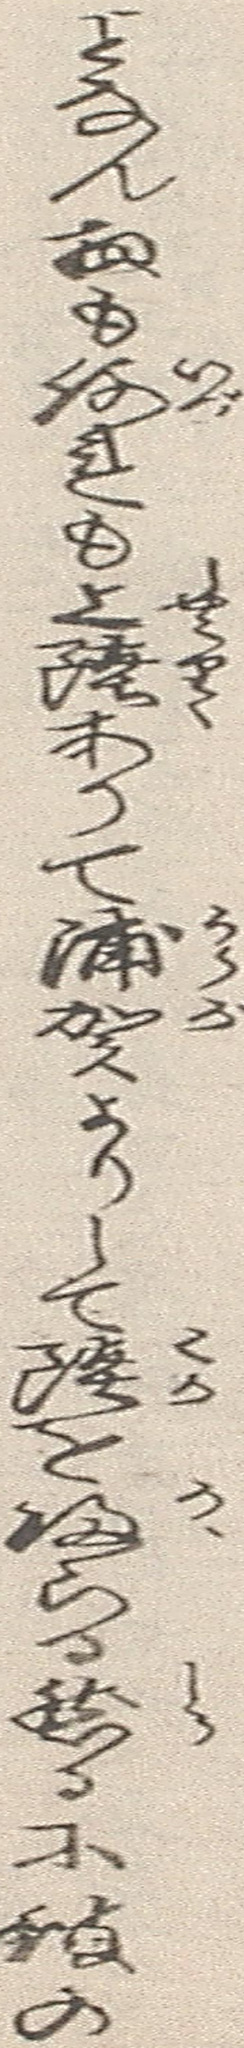となん扨も何れも上陸ありて浦賀よりして陸を帰らる然るに彼の
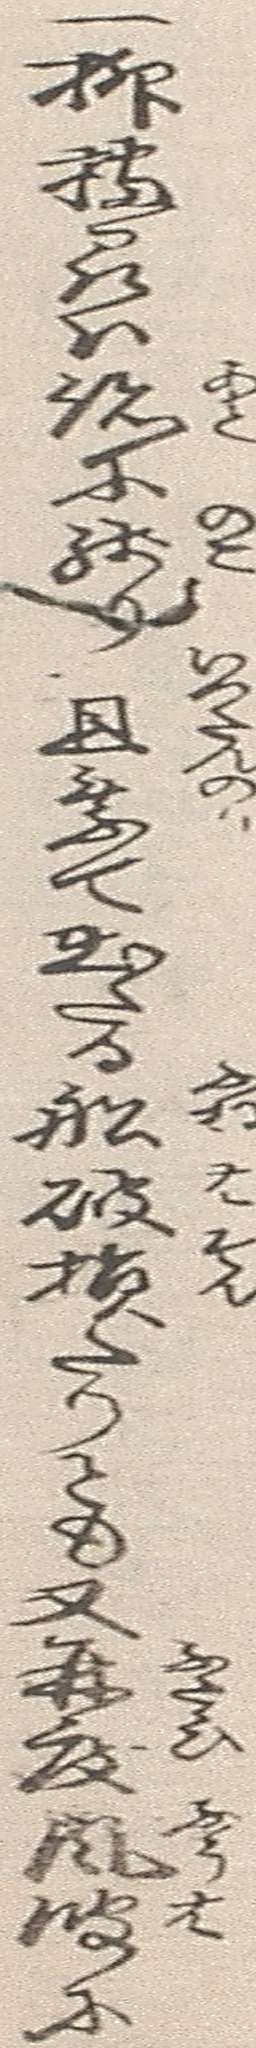一柳播州ハ跡に残り旦乗て出たる船破損たりとも又再度風波に
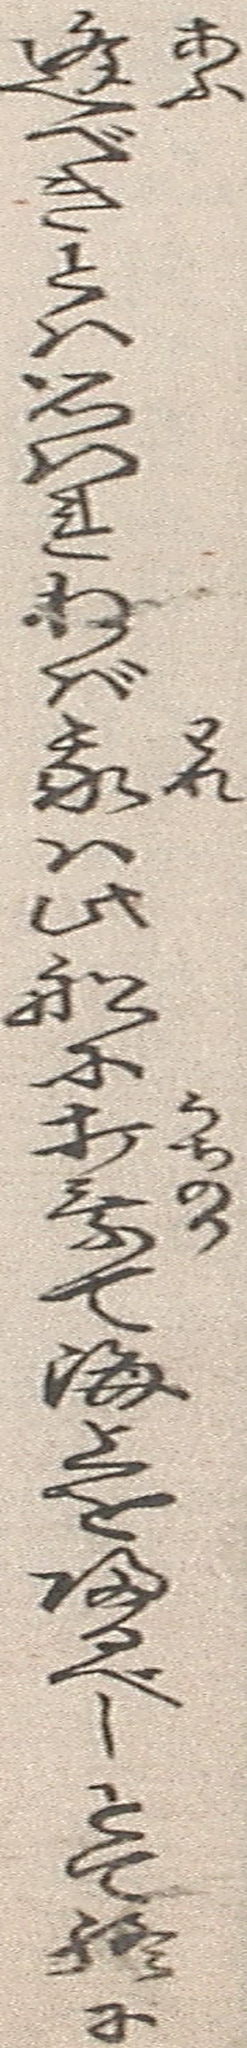逢べきとハ思ハれねバ我ハ此船に打乗て海上を帰るべしとて終に
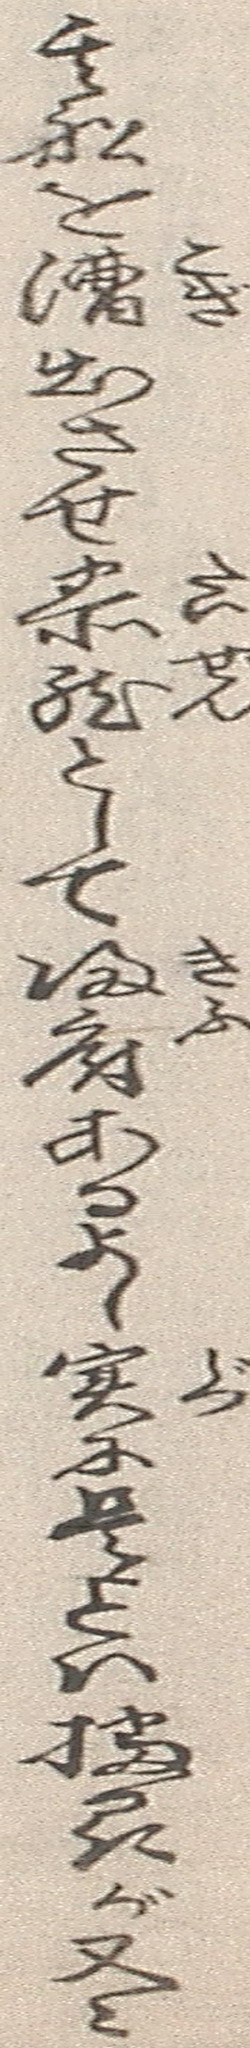其船を漕出させ泰然として帰府あるよし実に是ことハ播州が又々
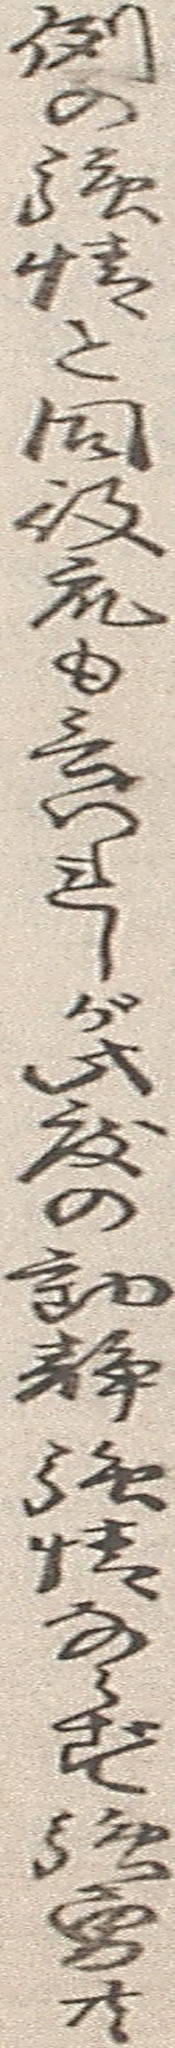例の強情と同役衆も言ハれしが此度の動静強情ならず強勇共
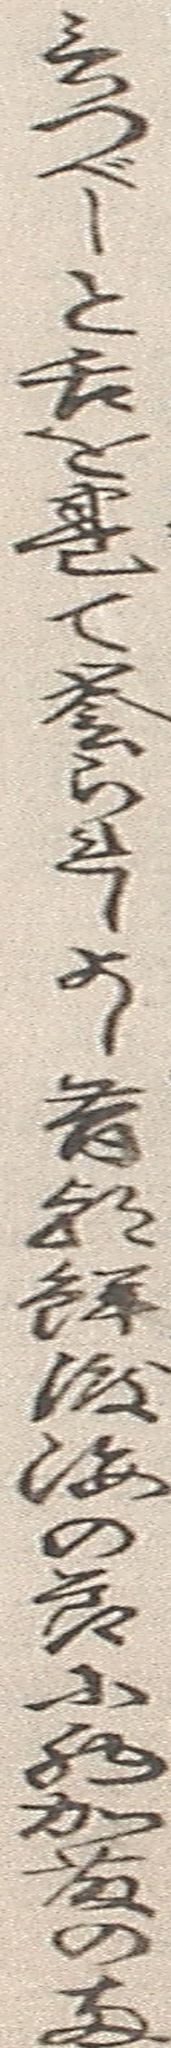言つべしと舌を巻て誉られしよし昔朝鮮渡海の節小西加藤の両
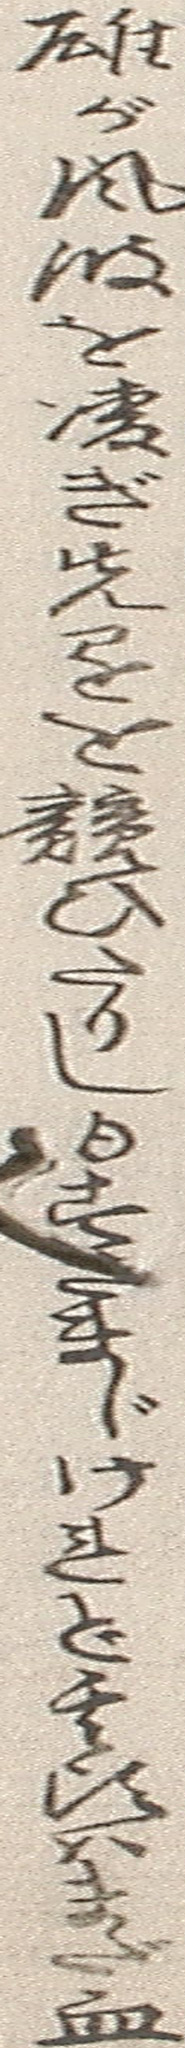雄が風波を凌ぎ先懸を競ひたりしもすさまじけれど其頃ハまだ血
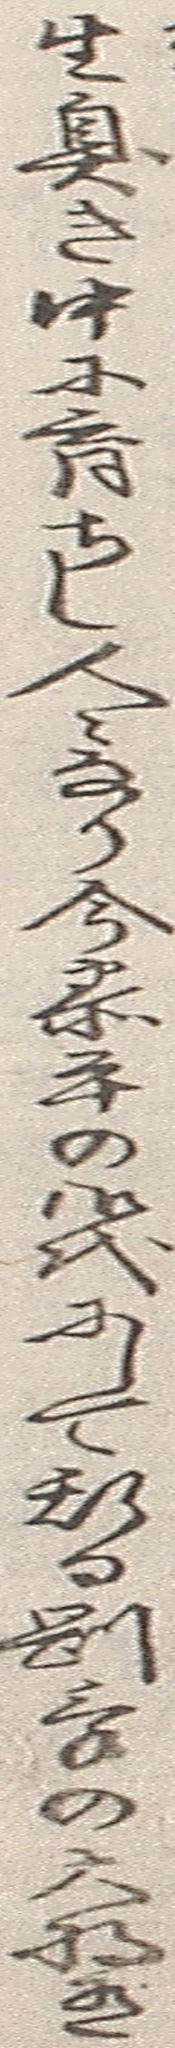生臭き中に育ちし人々なり今泰平の御代にて斯る剛気の大将有
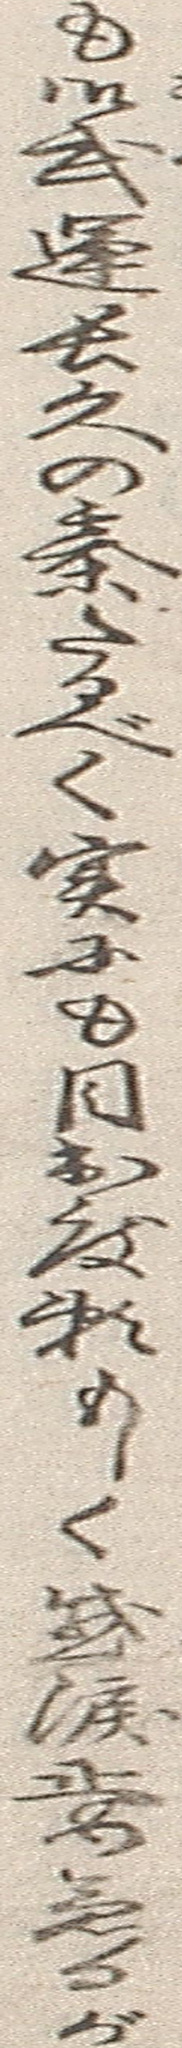も御武運長久の素たるべく実にも目出度頼もしく感涙止め兼るが
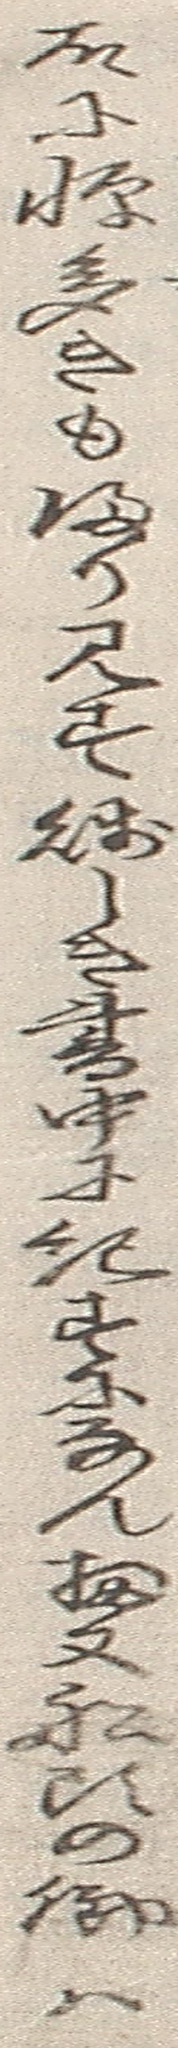故に憚多きも帰り見ず賎しき書中に紀すになん扨又船頭の働ハ
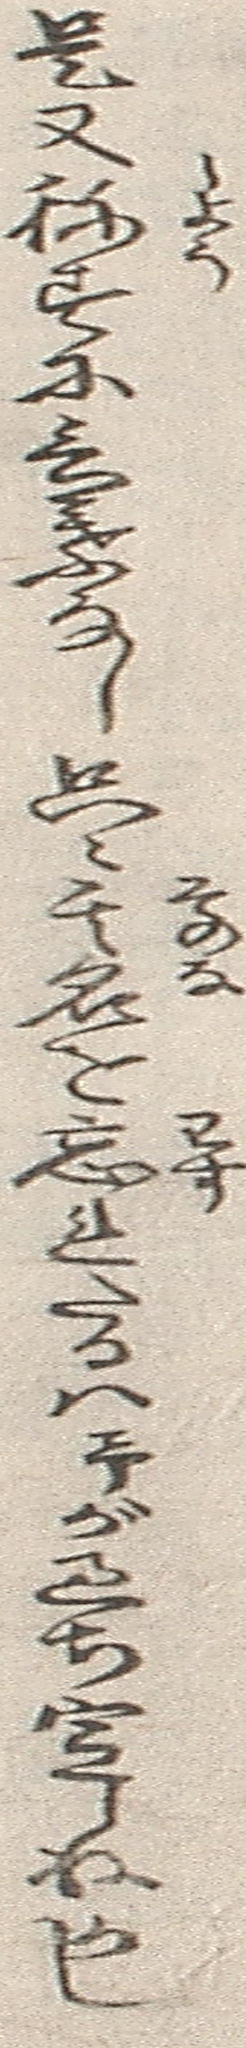是又称すに言葉なし只々其名を忘れたるハ予が過ち宜しねかし
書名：安政風聞集　上中下　全
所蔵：東京大学地震研究所図書室 Earthquake Research Institute Library, The University of Tokyo, JAPAN
